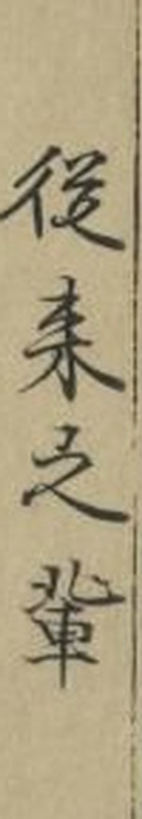従者之輩
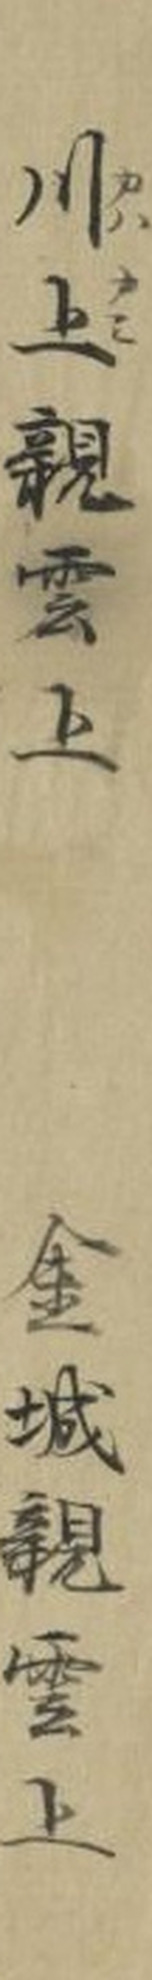川上親雲上金城親雲上
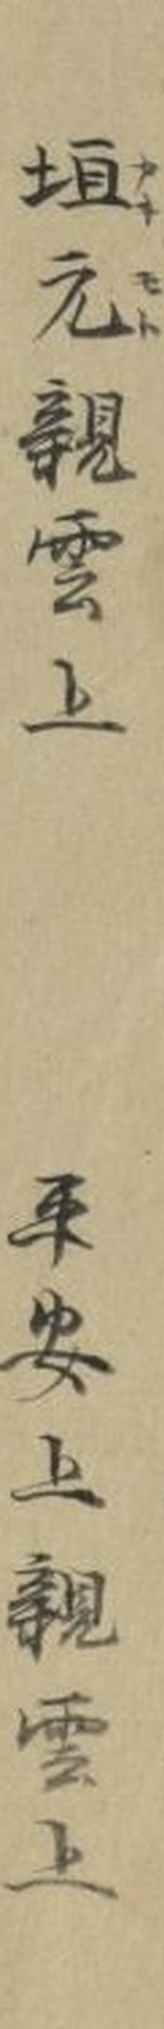垣元親雲上平安上親雲上
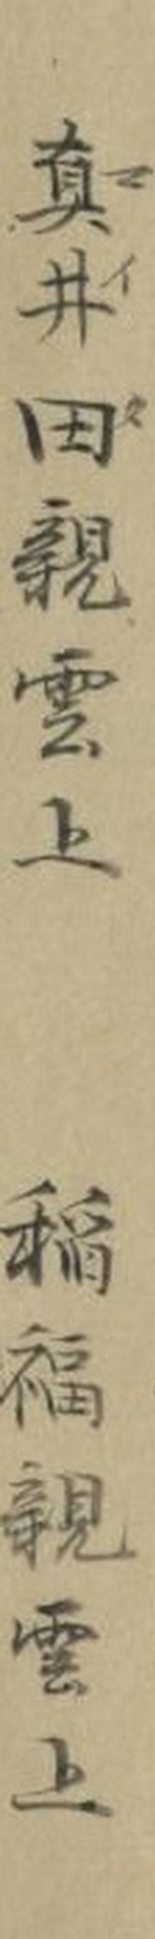真井田親雲上稲福親雲上
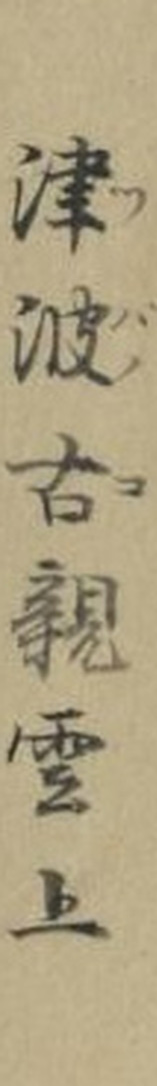津波古親雲上

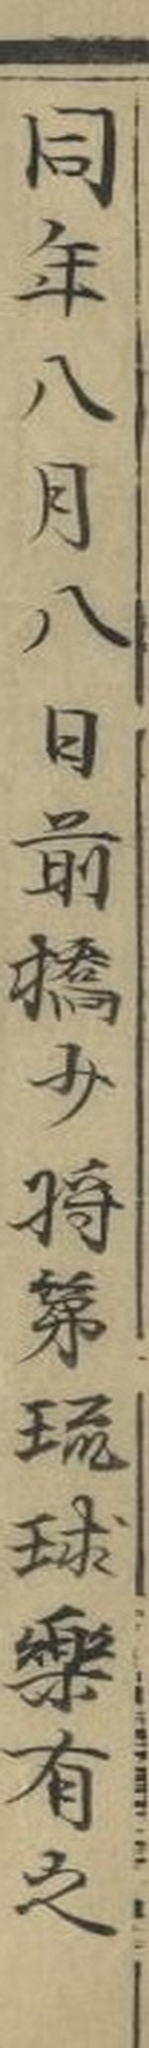同年八月八日前橋少将第琉球楽有之
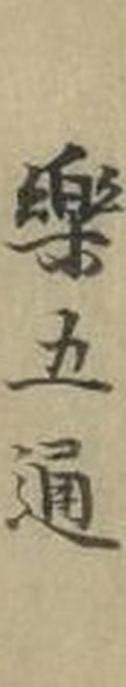楽五通
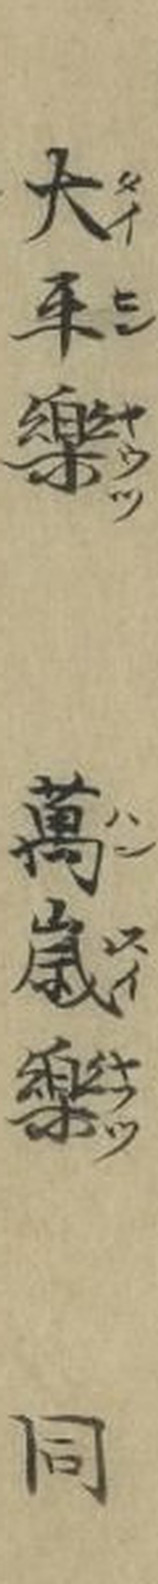大平楽萬歳楽同
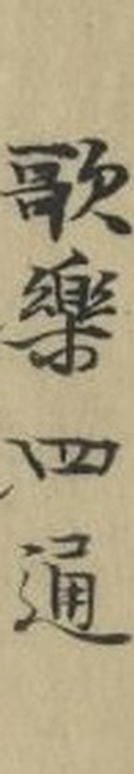歌楽四通
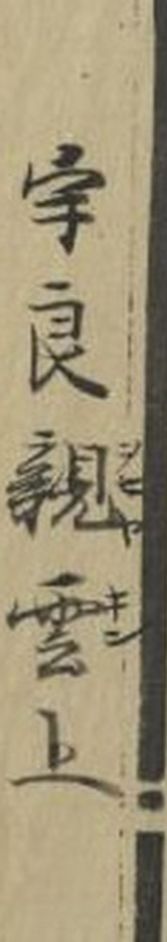頭取宇良親雲上
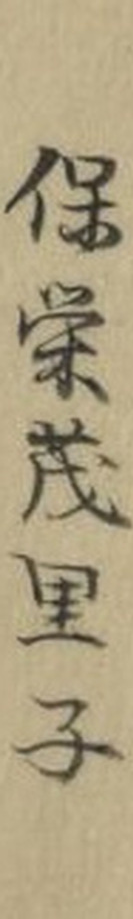楽人保栄茂里子
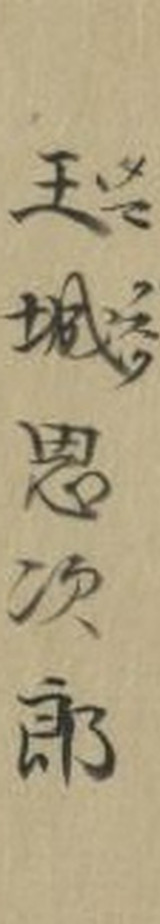同玉城思次郎
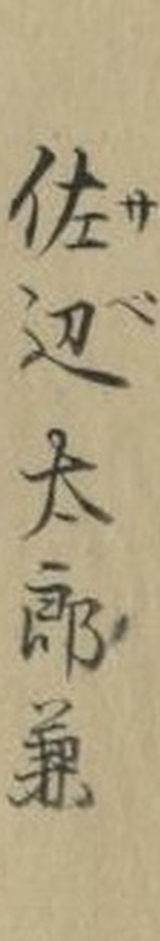同佐辺太郎兼
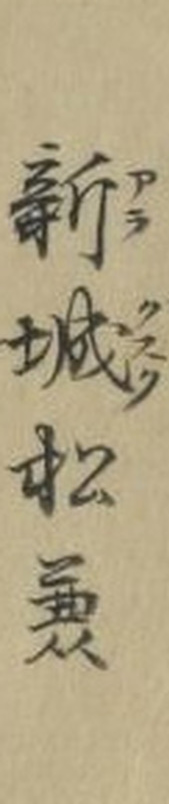同新城松兼
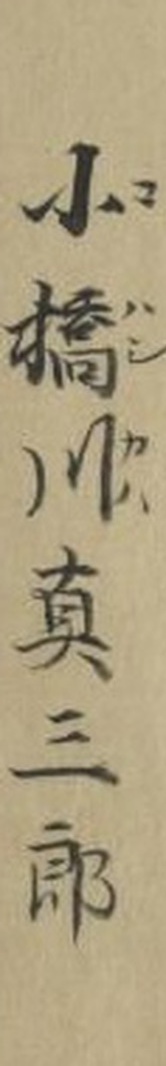同小橋川真三郎

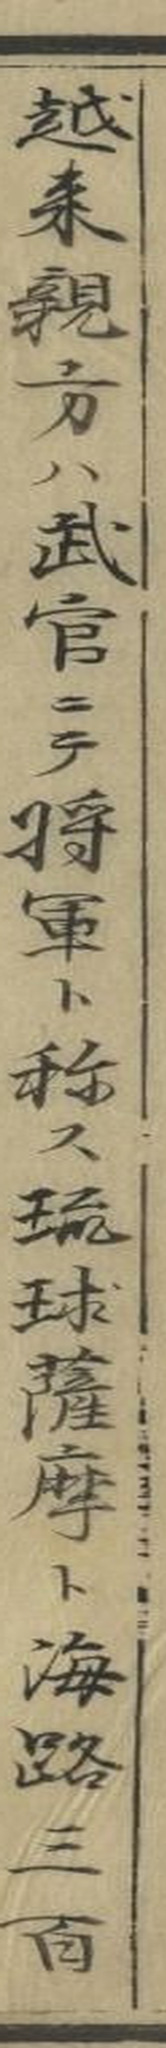越来親方ハ武官ニテ将軍ト称ス琉球薩摩ト海路三百
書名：琉球往来（下）
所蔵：University of the Ryukyus Library
